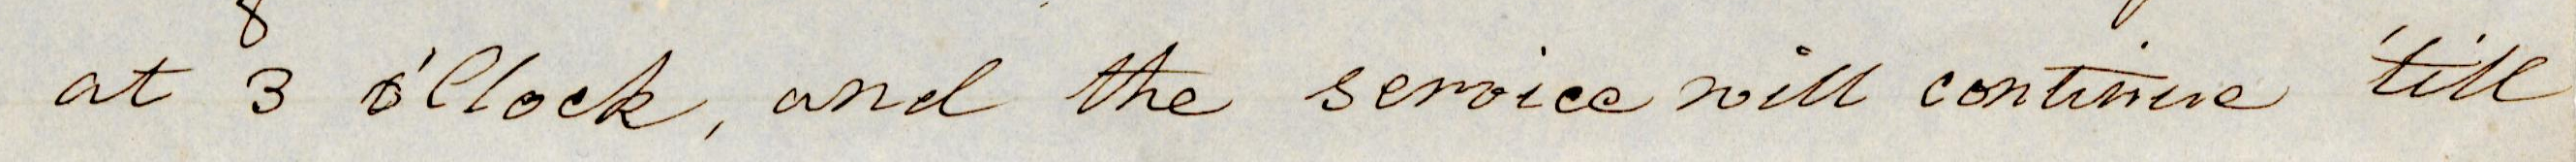at 3 o'Clock, and the service will continue 'till
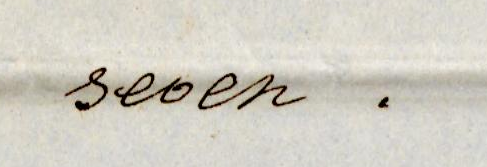seven.
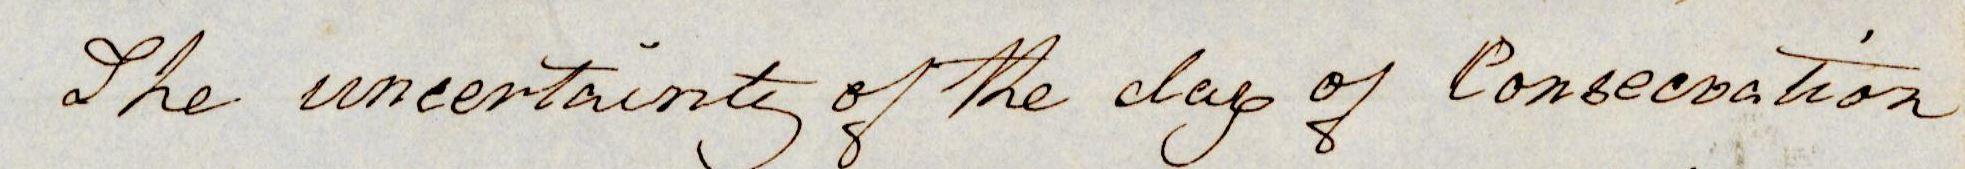The uncertainty of the day of Consecration
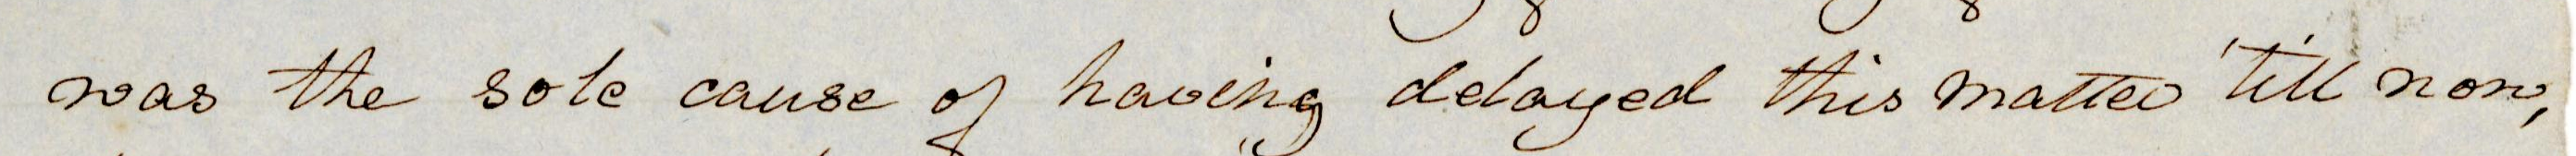was the sole cause of having delayed this matter 'till now,
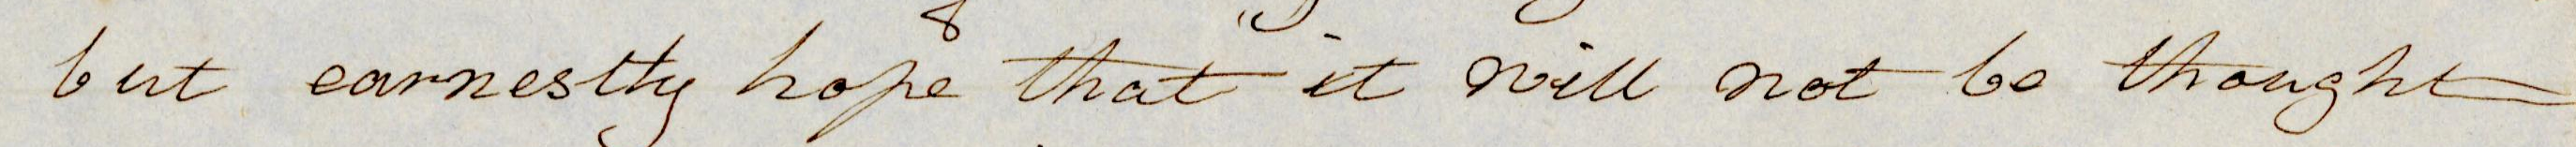but earnestly hope that it will not be thought
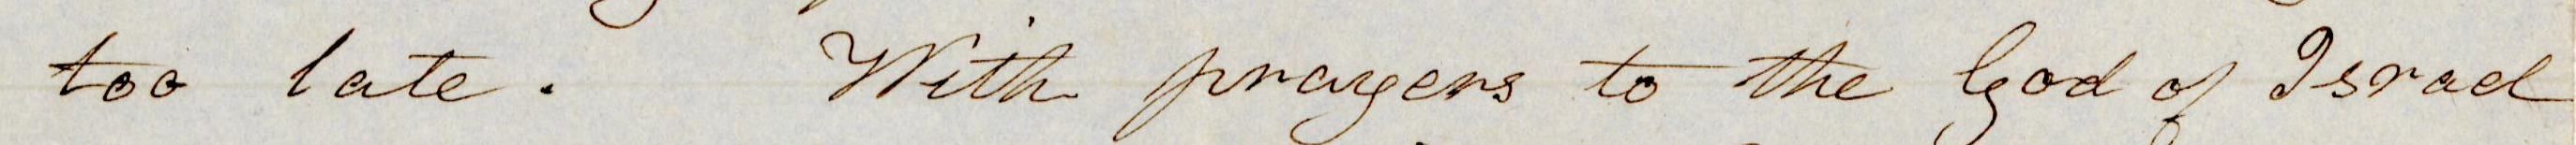too late. With prayers to the God of Isreal
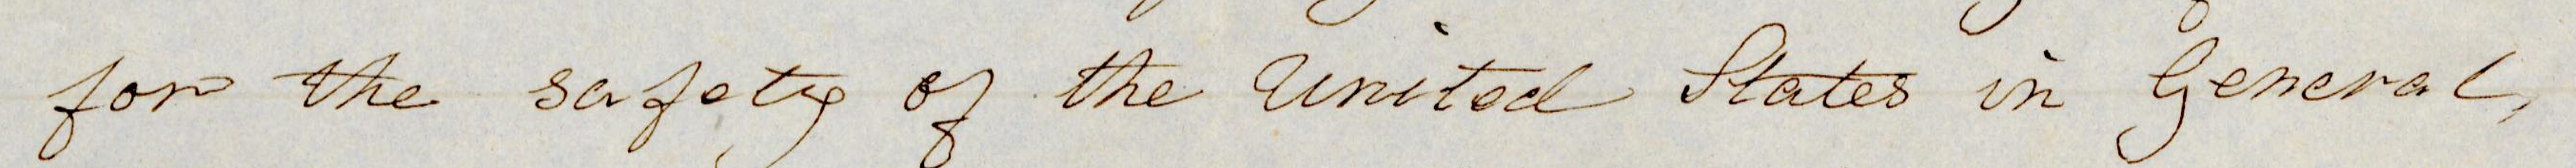for the safety of the United States in General,
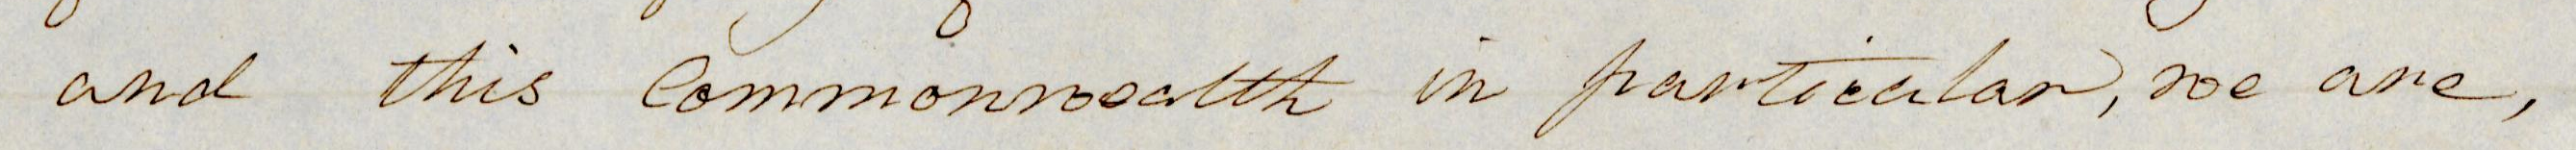and this Commonwealth in particular, we are,
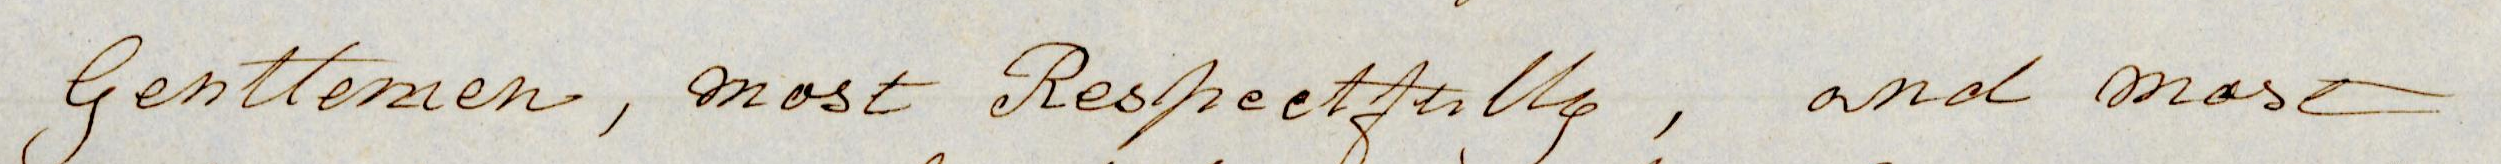Gentlemen, most Respectfully, and most
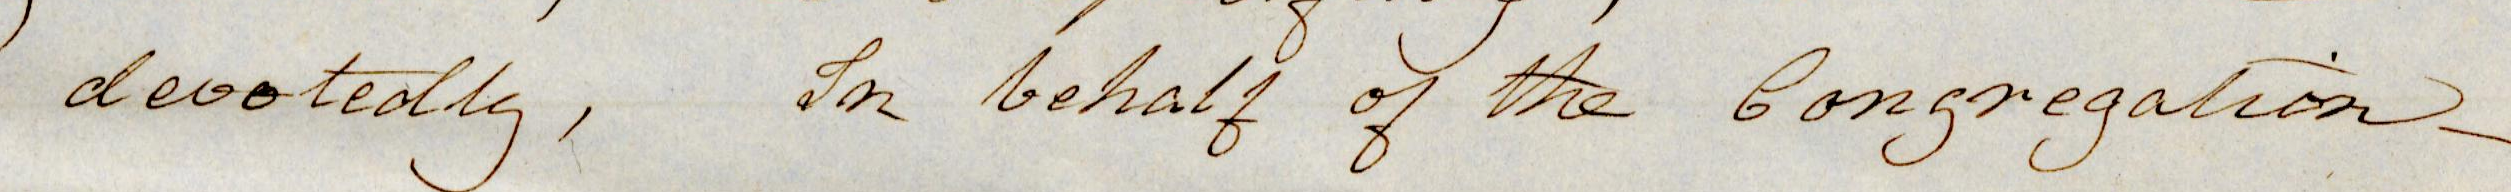devotedly, In behalf of the congregation
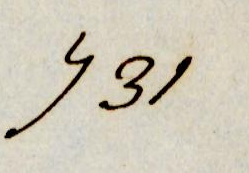731
